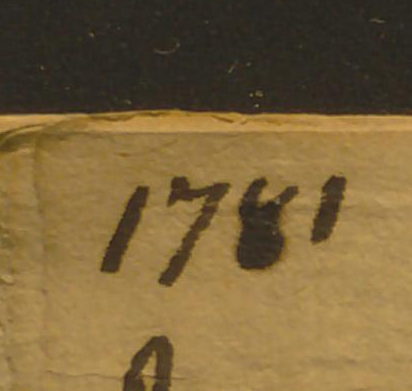1781
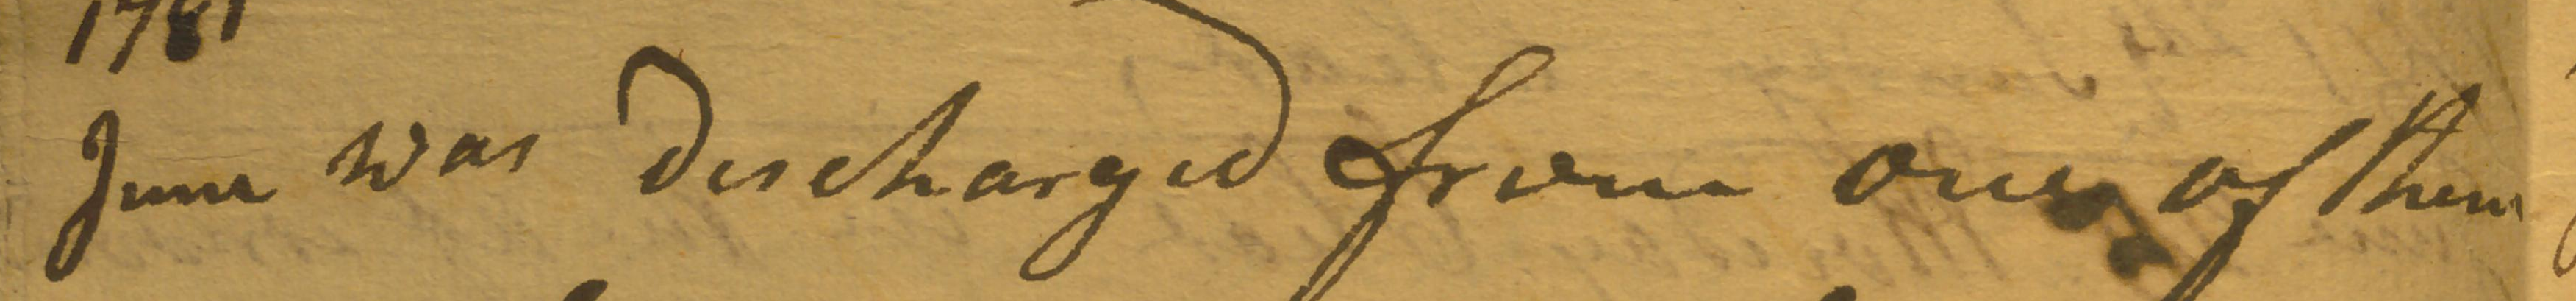June was discharged from one of them
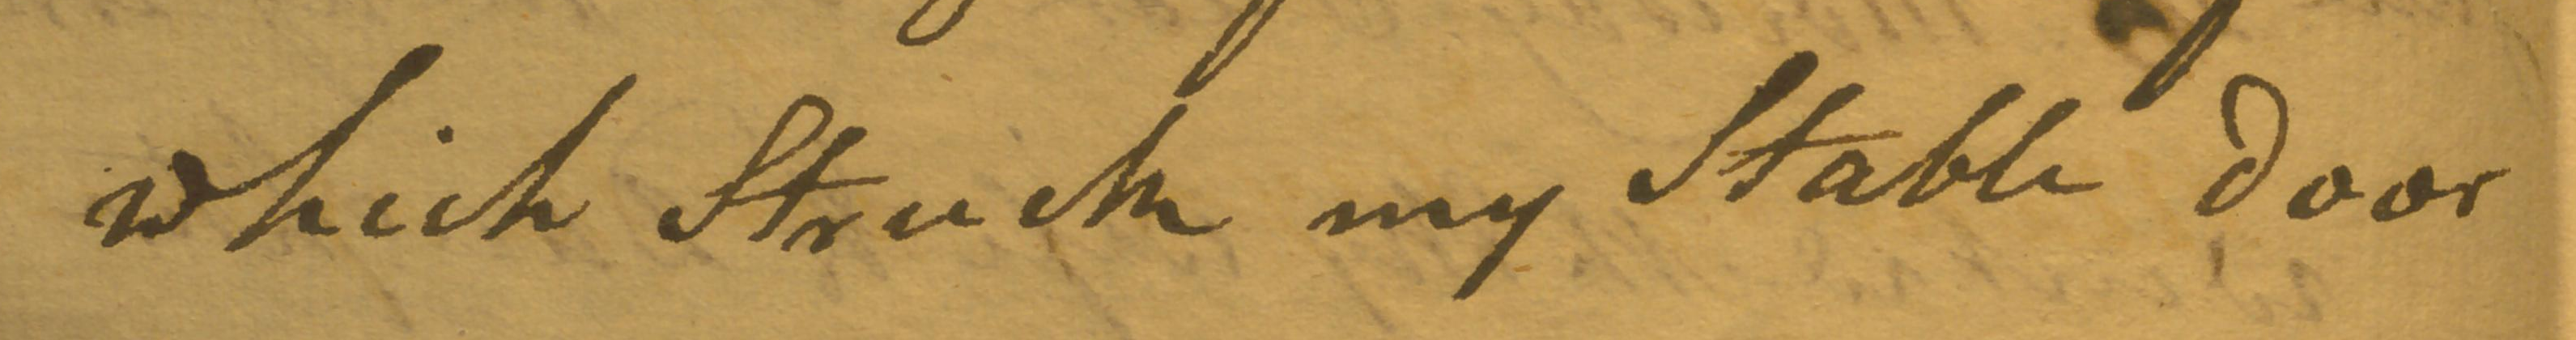which Struck my Stable door
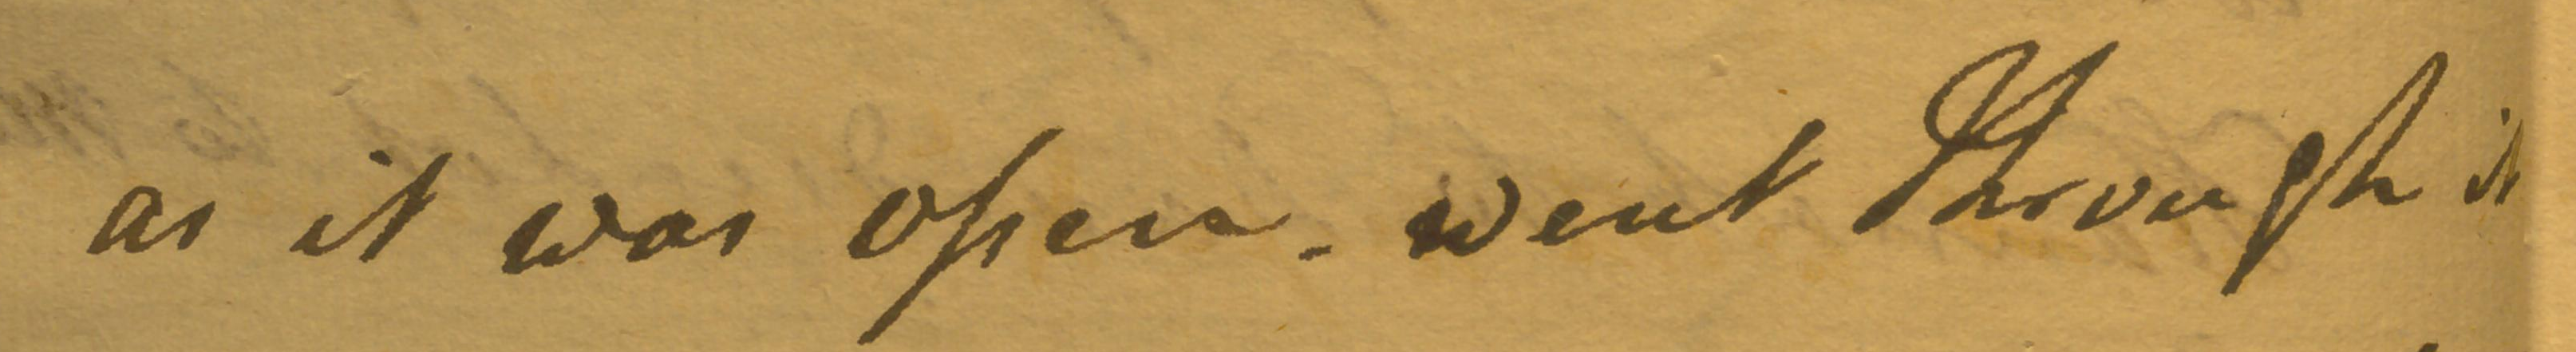as it was open. went through it
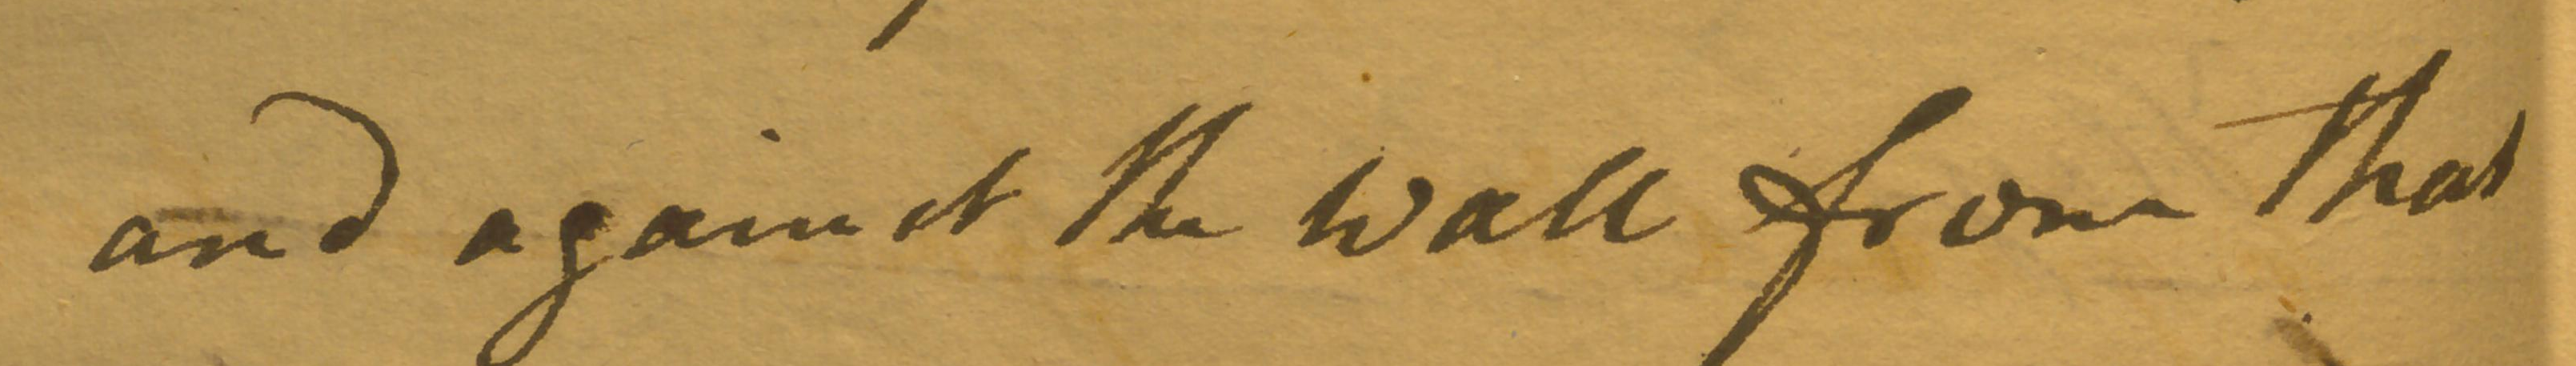and against the wall from that
